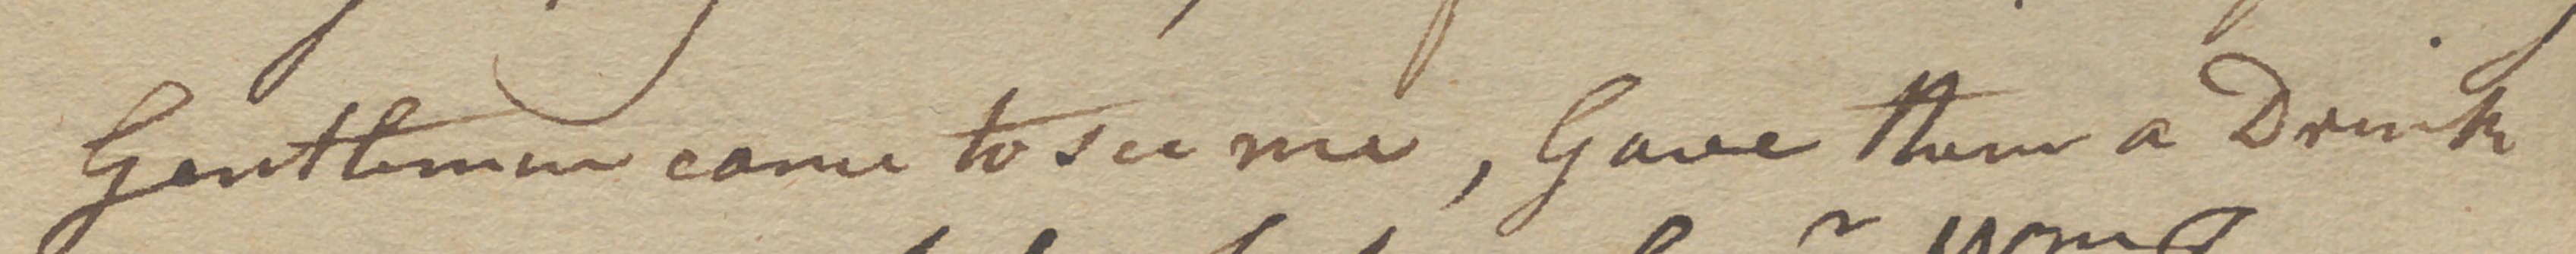Gentlemen came to see me, Gave them a Drink
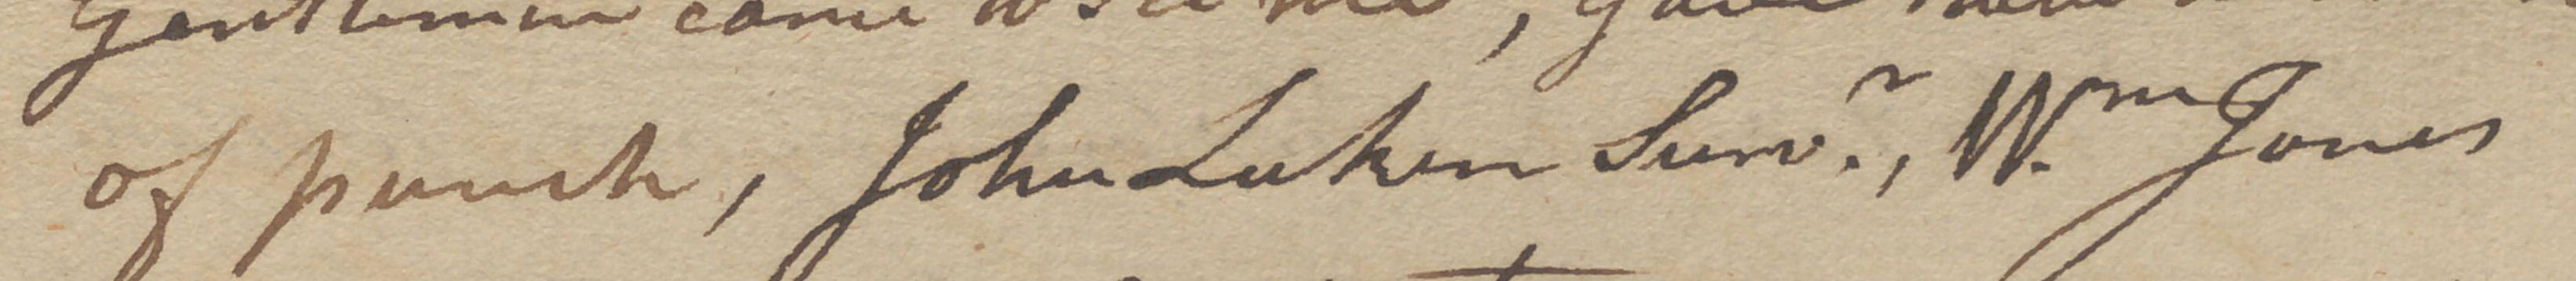of punch, John Luken Sen^r., W^m. Jones
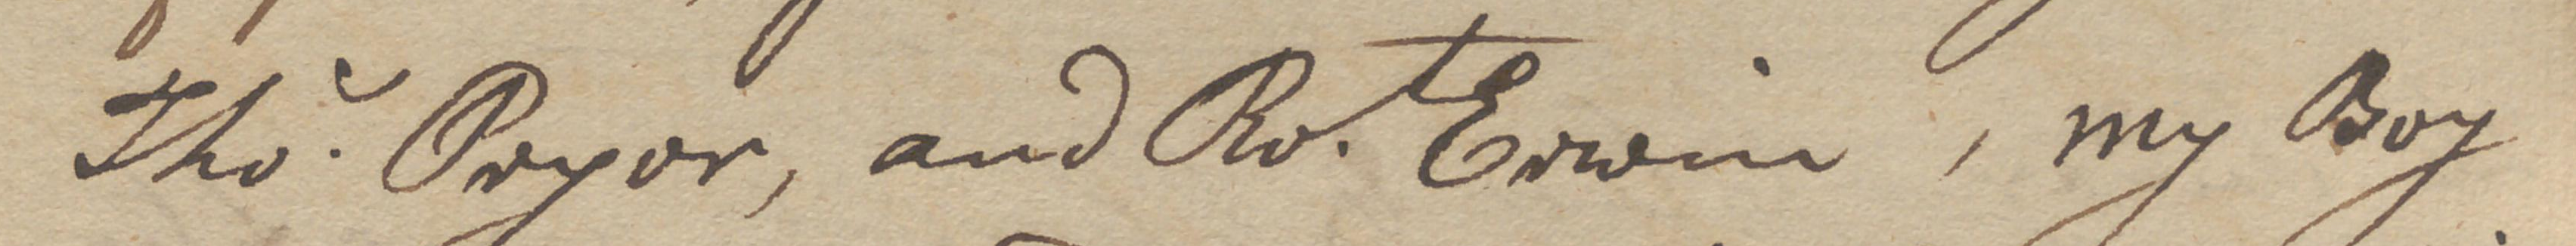Tho^s. Pryor, and Ro^t. Erwin, my Boy
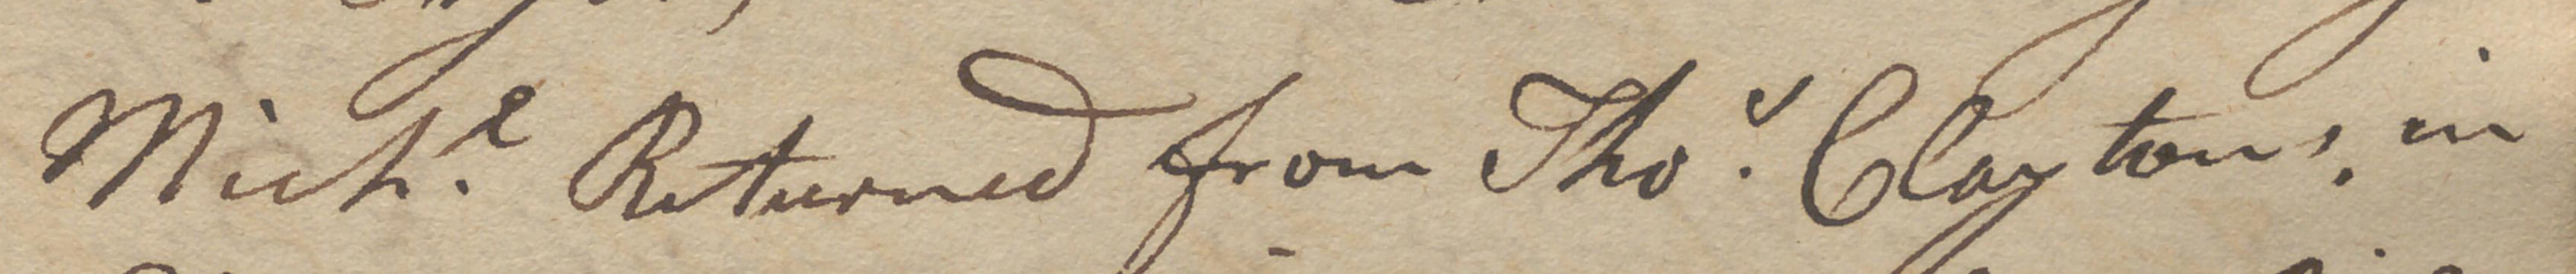Mich^l. Returned from Tho^s. Claytons in
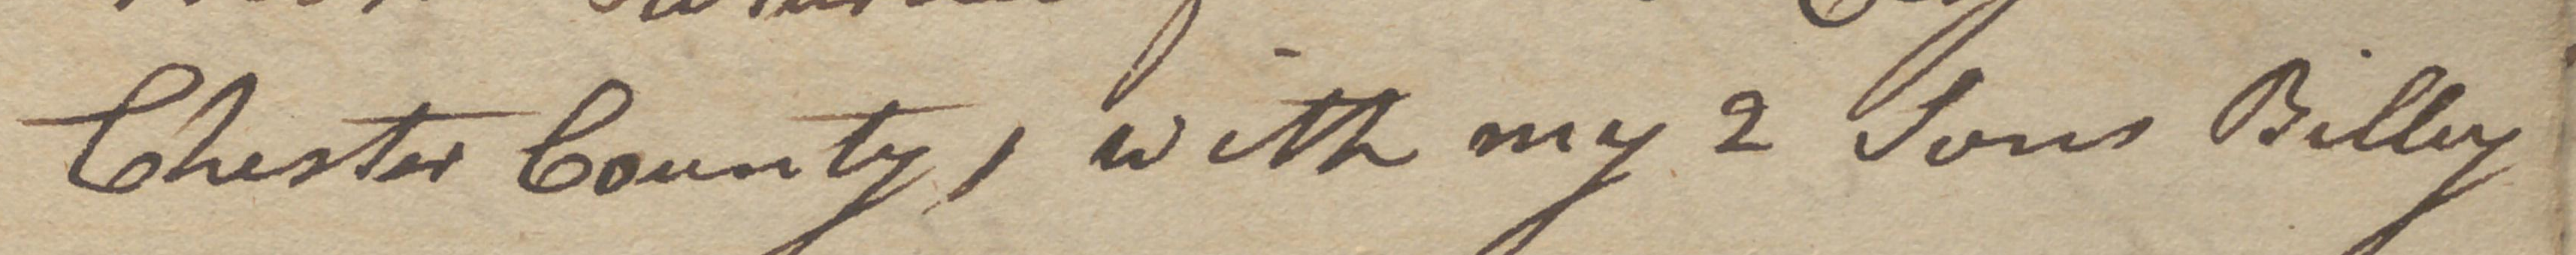Chester County, with my 2 Sons Billey
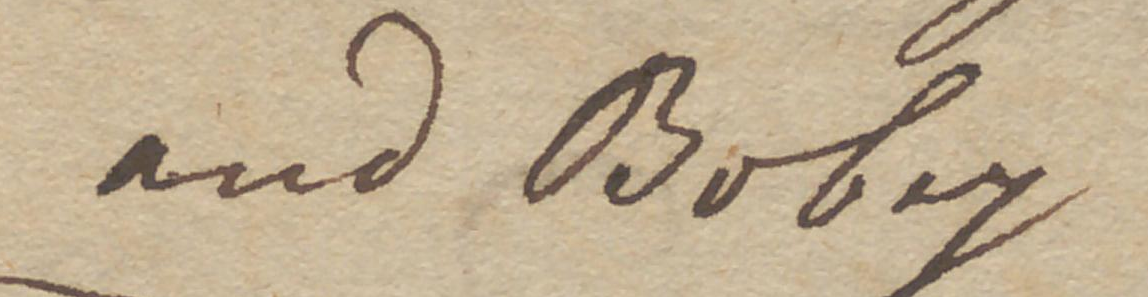and Bobey
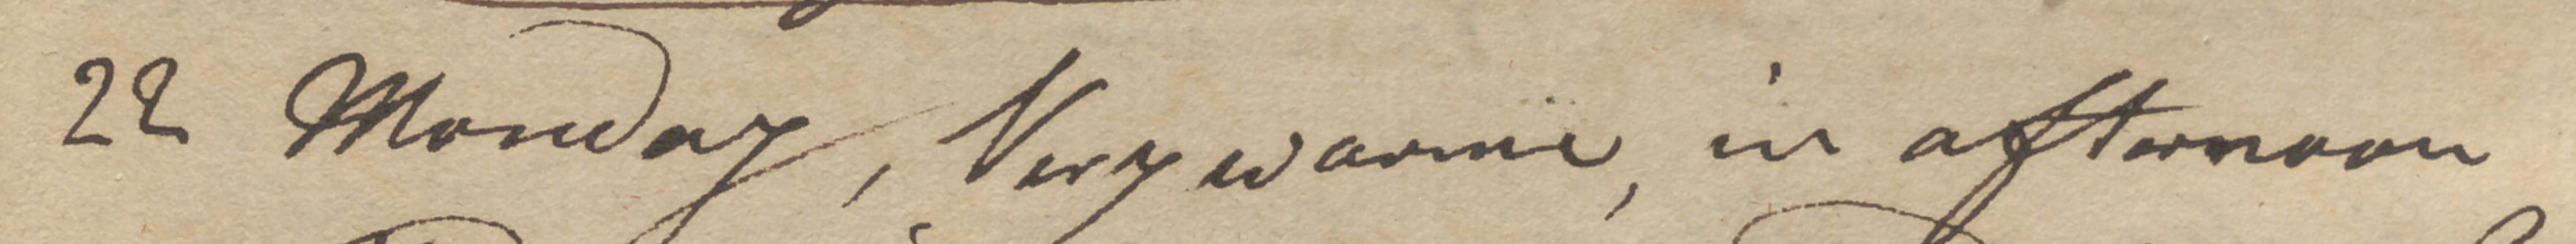22 Monday, Very warme in afternoon
